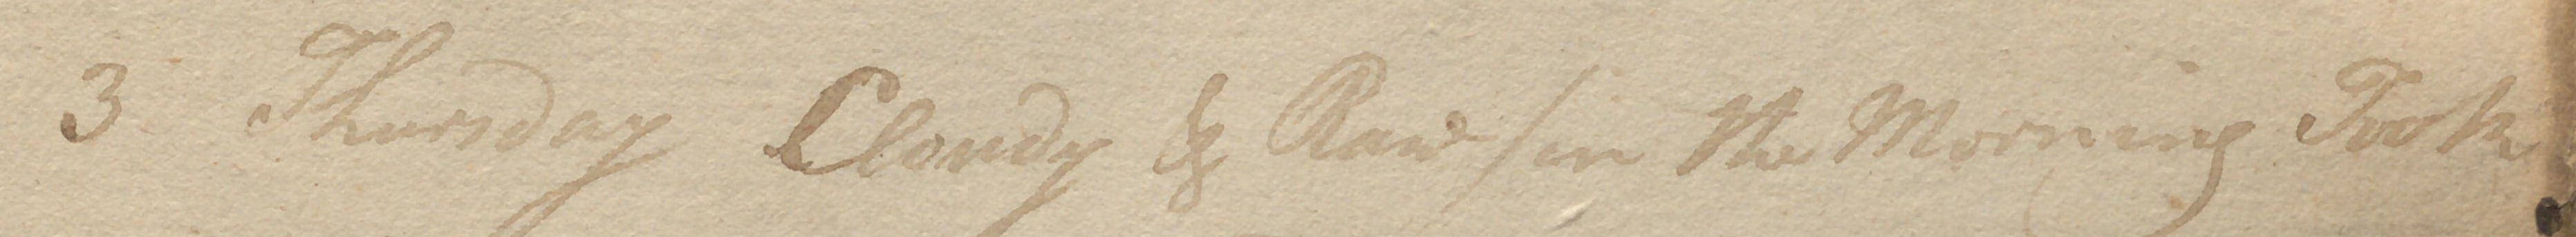3 Thursday Cloudy & Raw / the Morning Took
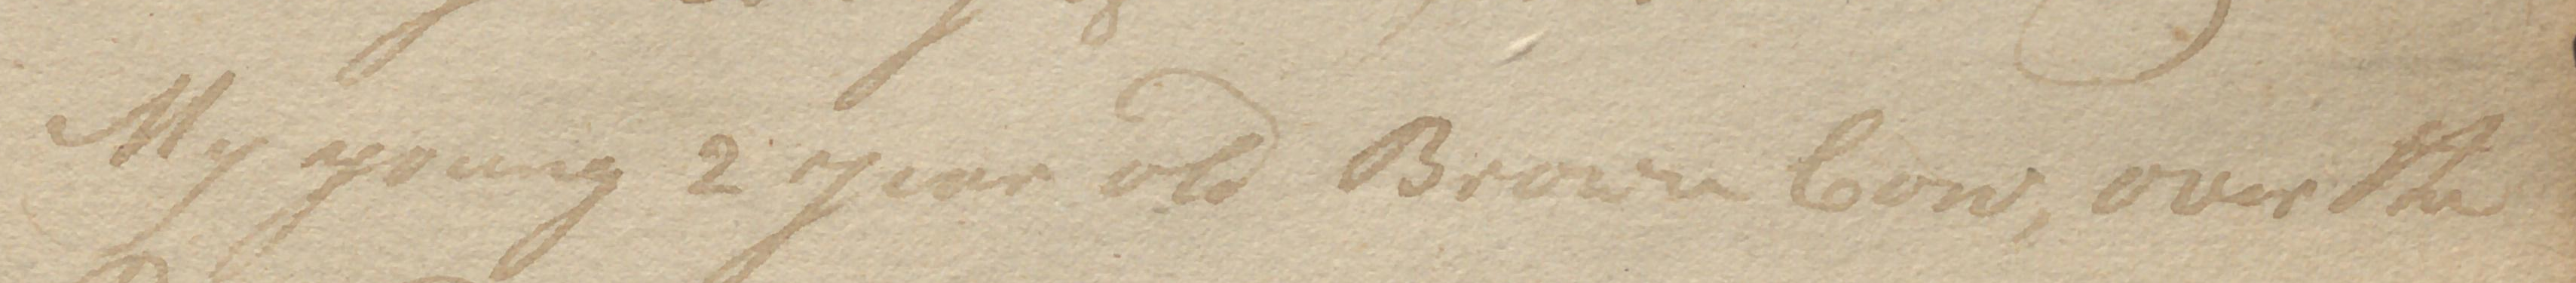My young 2 year old Brown Cow over the
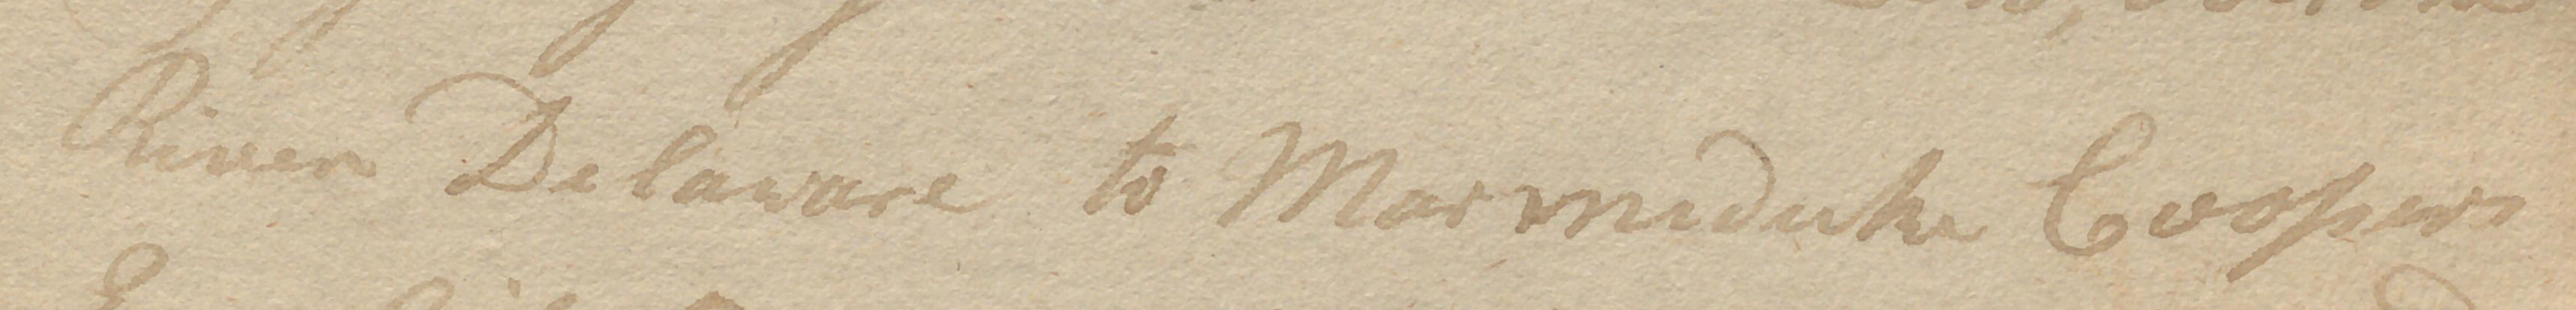River Delaware to Marmiduke Cooper
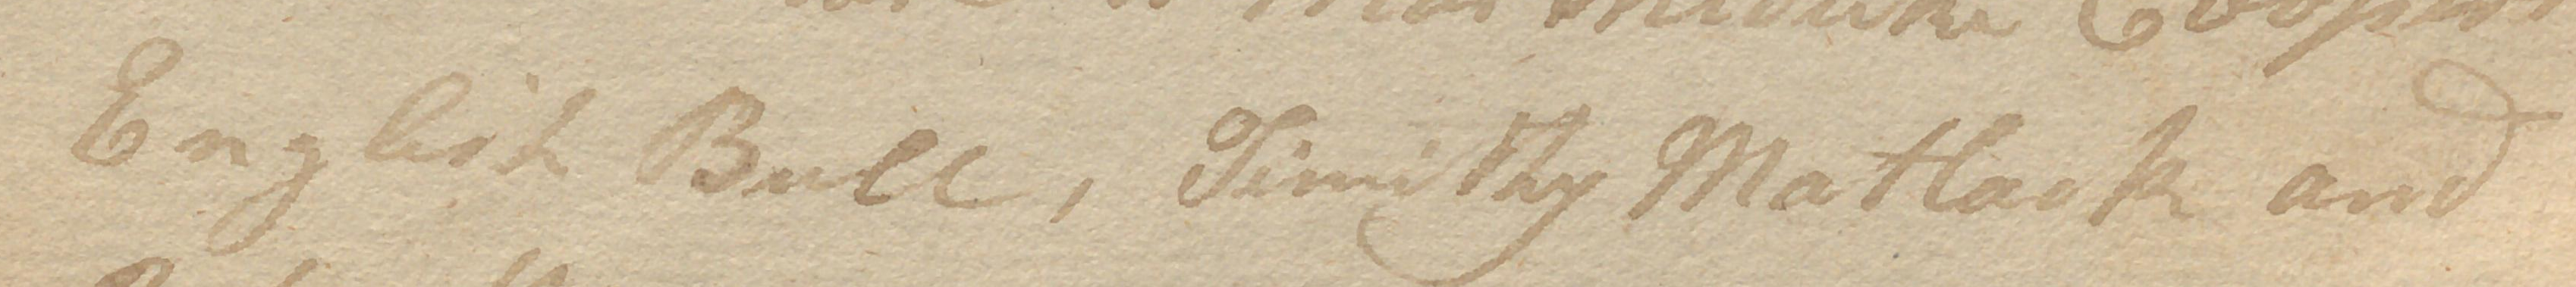English Bull, Timothy Matlack and
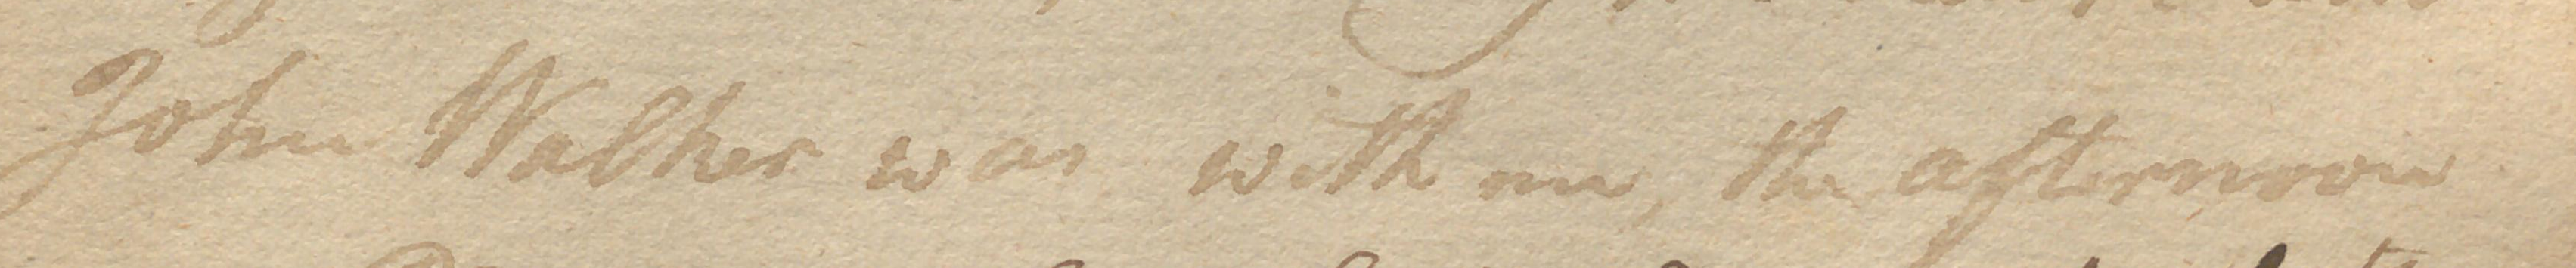Johe Walker was with me the afternoon
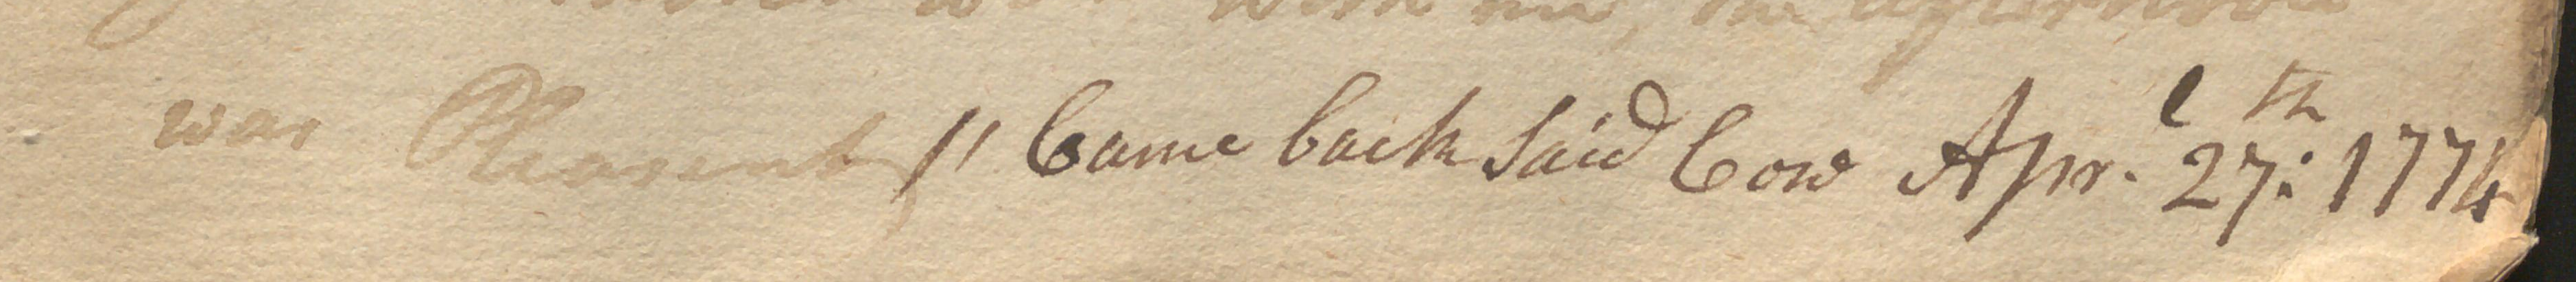was Pleasent Came back Said Cow Apr^l. 27^th: 1774
